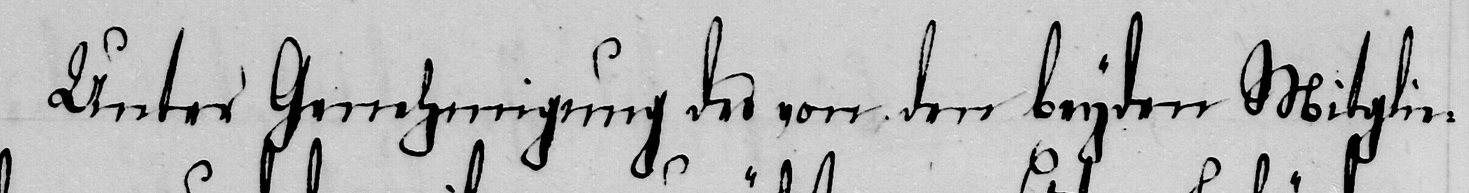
Unter Genehimigung des von den beyden Mitglie¬
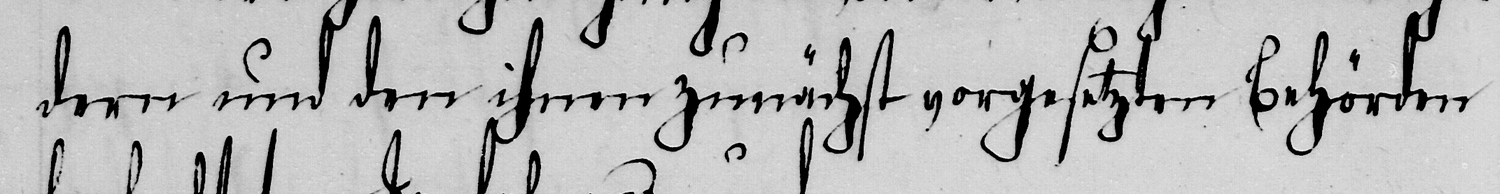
dern und den ihnen zunächst vorgesetzten Behörden
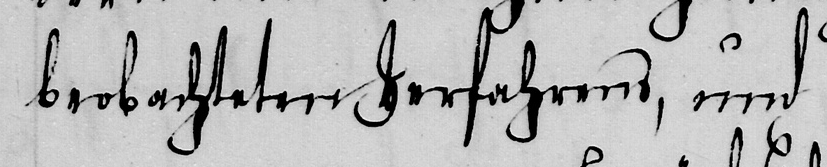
beobachteten Verfahrens, und:
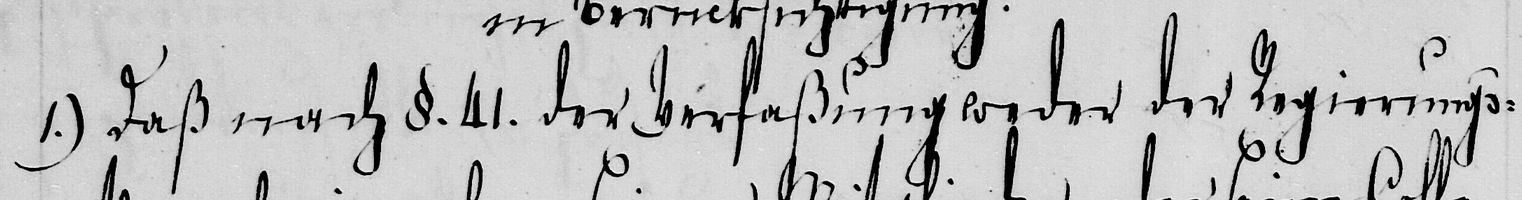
1.) Daß nach §. 41. der Verfaßung weder der Regierungs¬
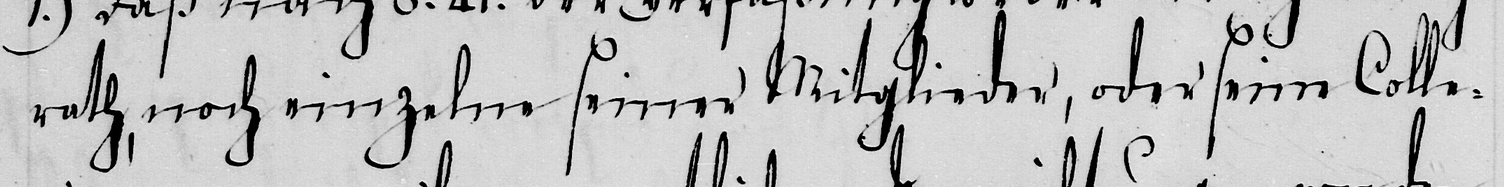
rath, noch einzelne seiner Mitglieder, oder seine Colle¬
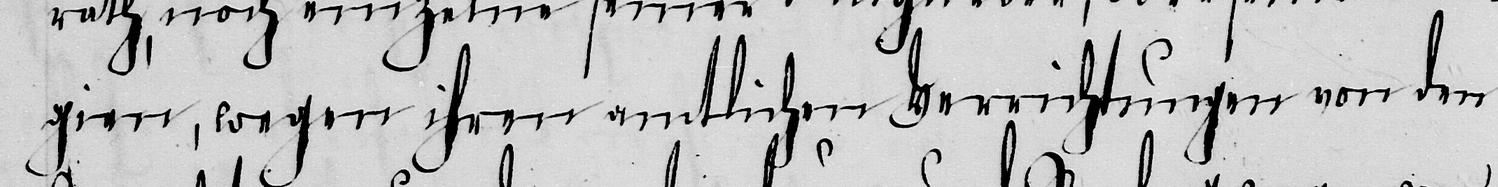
gien, wegen ihren amtlichen Verrichtungen von den
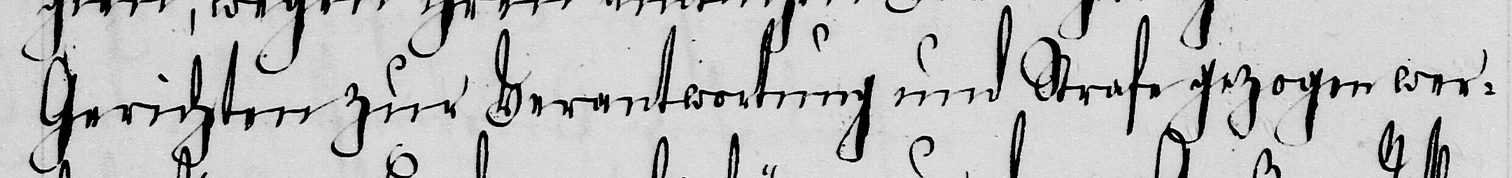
Gerichten zur Verantwortung und Strafe gezogen wer¬
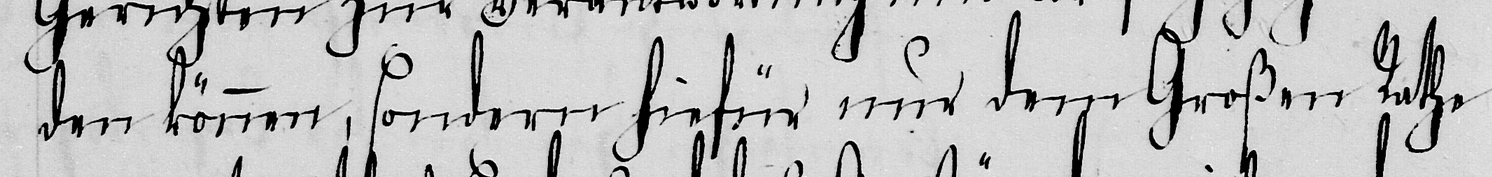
den können, sondern hiefür nur dem Großen Rathe
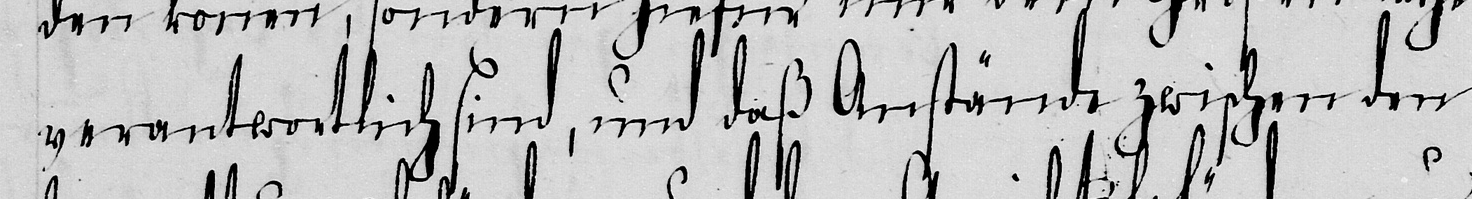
verantwortlich sind, und daß Anstände zwischen den
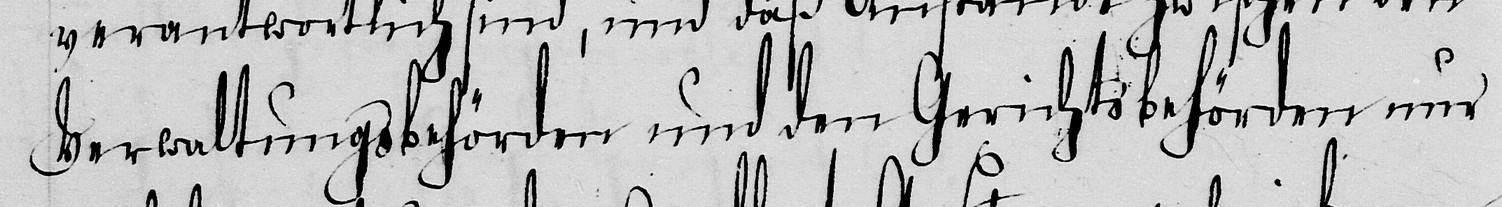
Verwaltungsbehörden und den Gerichtsbehörden nur
